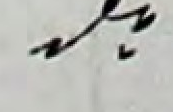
Do
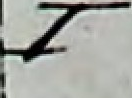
I
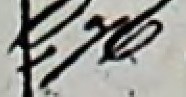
0,76
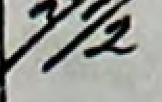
7 1/2
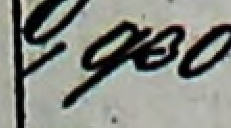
0,900
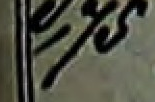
3,75
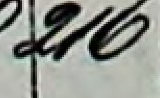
216
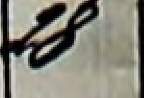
28
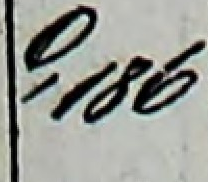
0,186
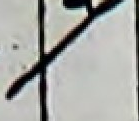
7
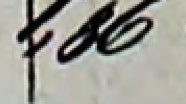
1,86
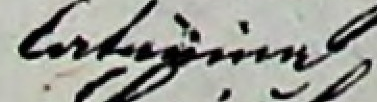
Catarina
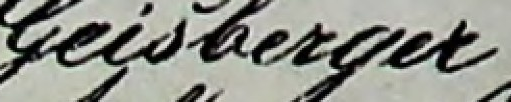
Geisberger
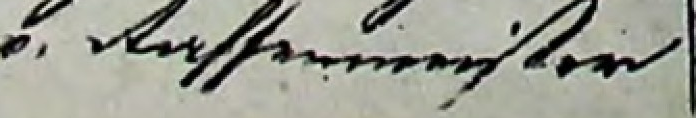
v. Rassenmeister
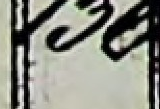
136
